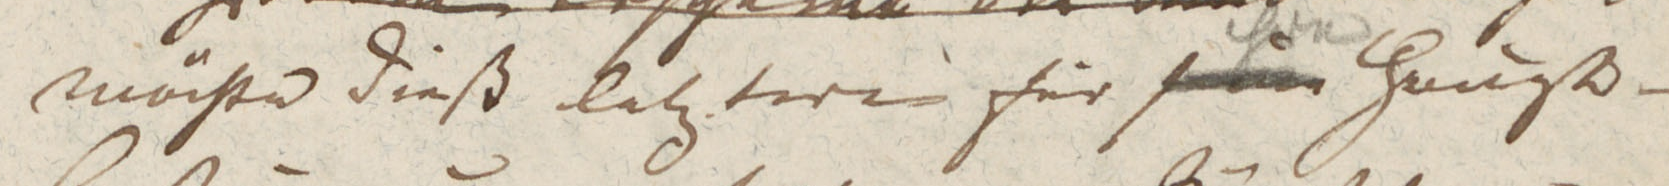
möchte diess letztere für seine ihre Haupt-
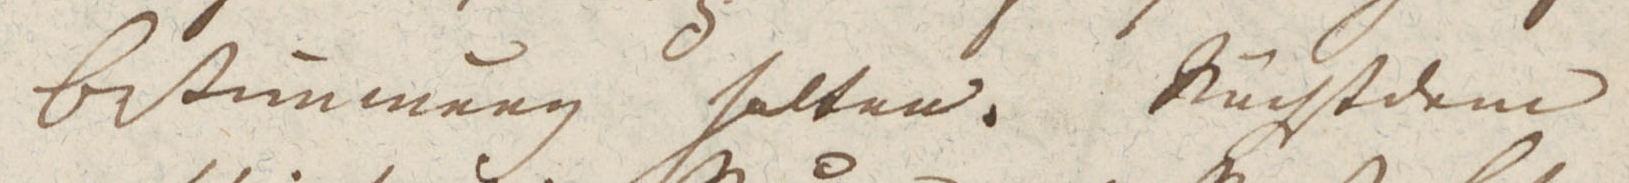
bestimmung halten. Nächstdem
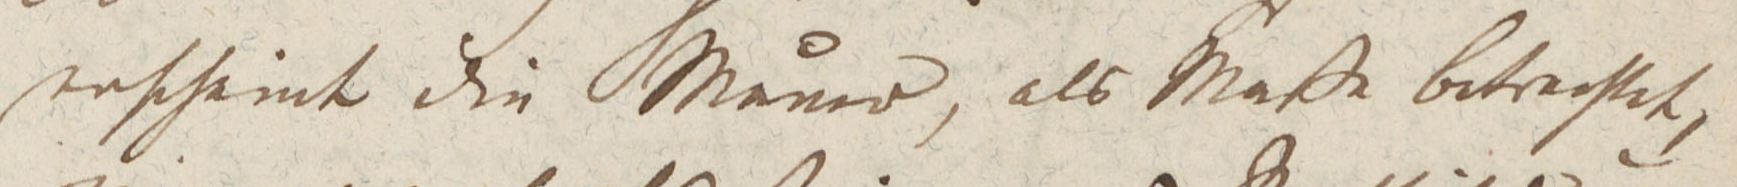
erscheint die Mauer, als Masse betrachtet,
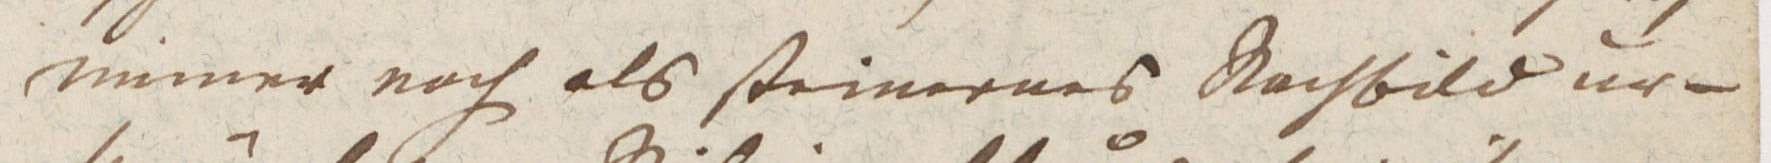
immer noch als steinernes Nachbild ur-
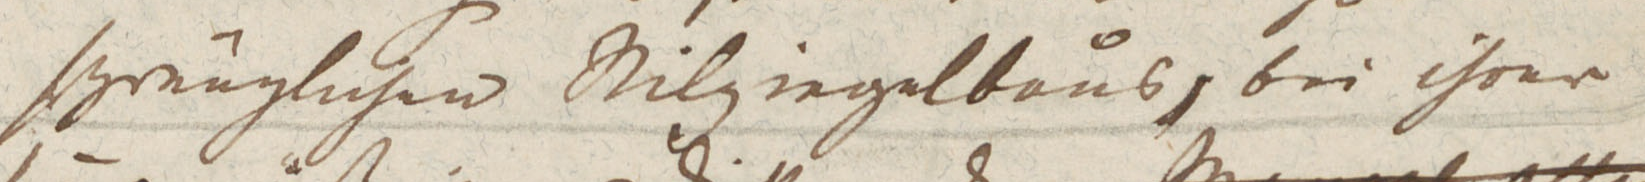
sprünglichen Nilziegelbaus, bei ihrer
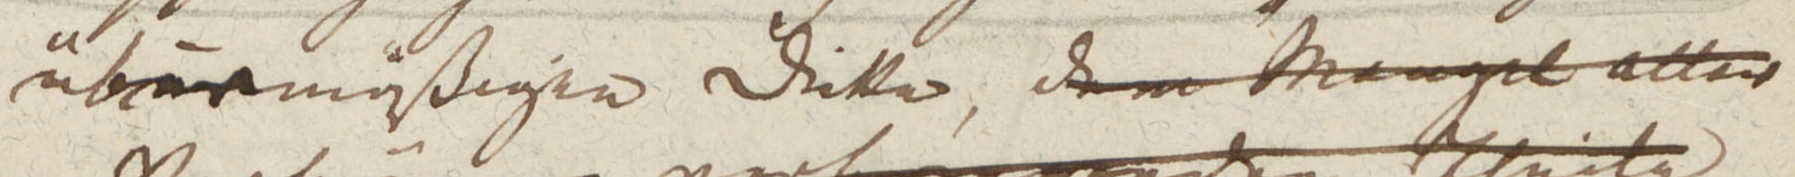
übunermässigen Decke, dem Mangel aller
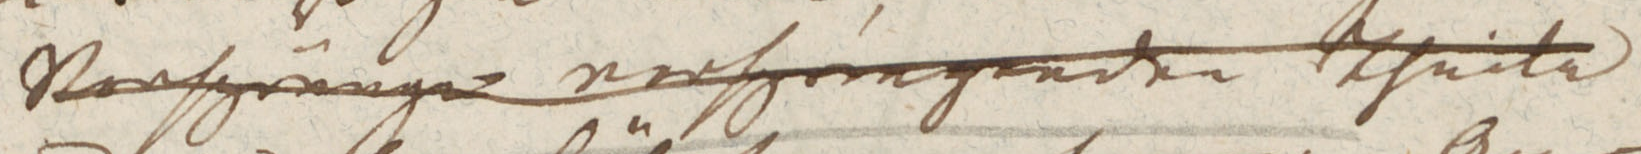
Vorsprünge vorspringenden Theile
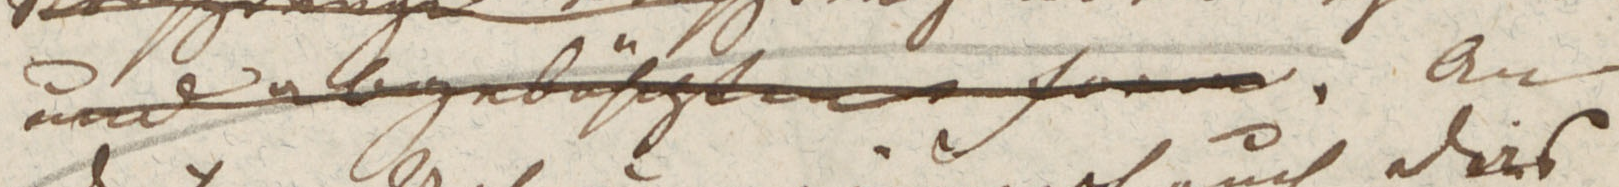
und abgebäsigten Form. An
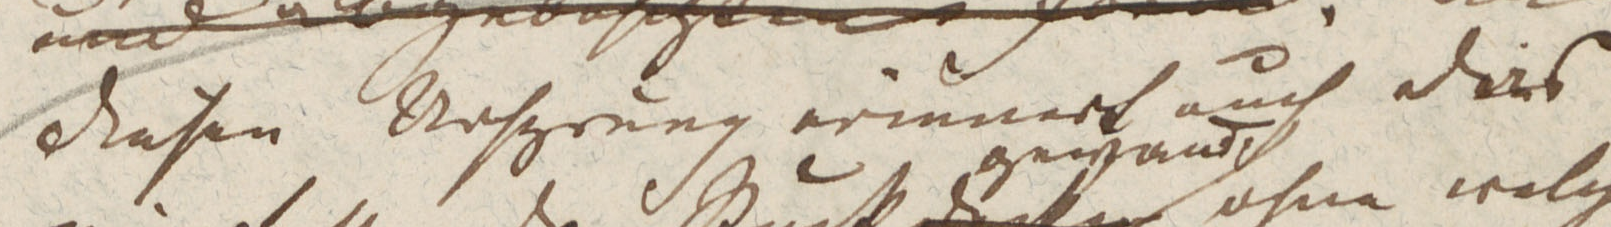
diesen Ursprung erinnert auch dieas
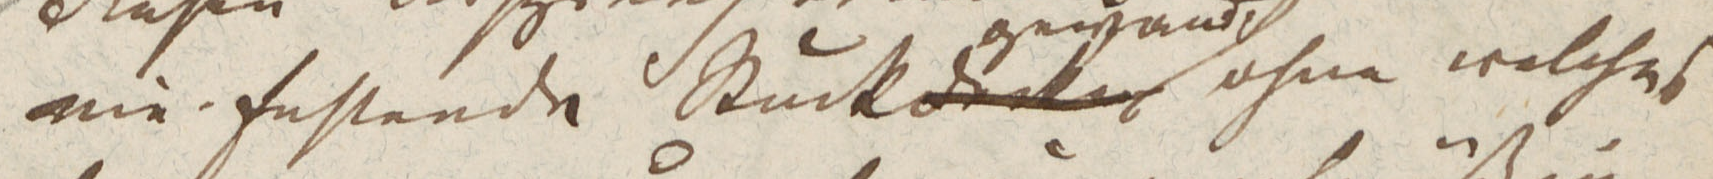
nie fehlende Stuckdeckegewand, ohne welches
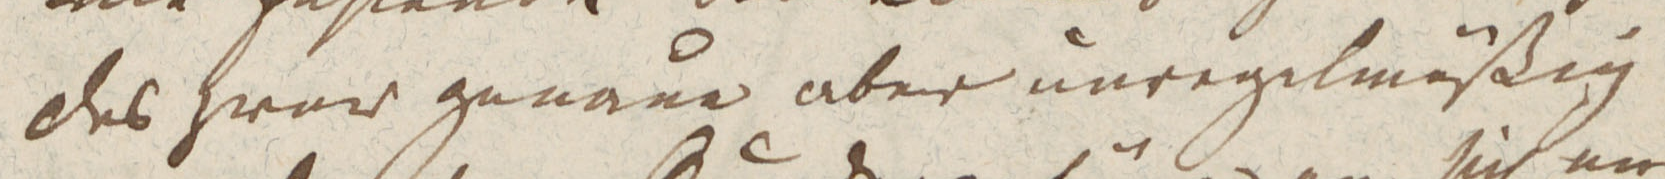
das zwar genaue aber unregelmässig
